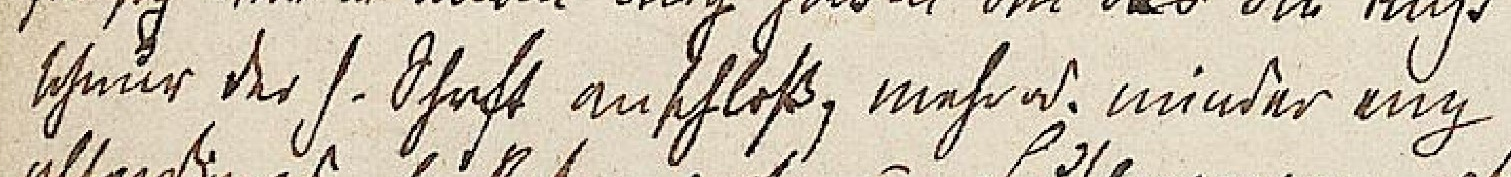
schnur der H. Schrift anschloß, mehr o. minder eng
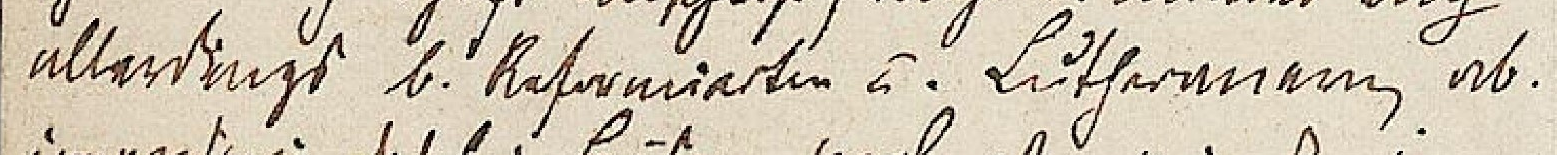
allerdings b. Reformierten u. Lutheranen, ab.
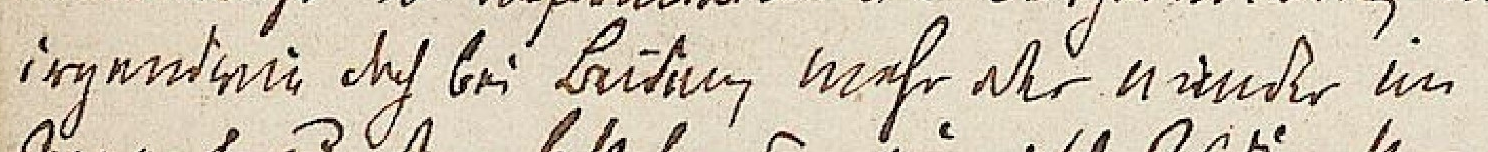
irgendwie doch bei Beiden, mehr oder minder im
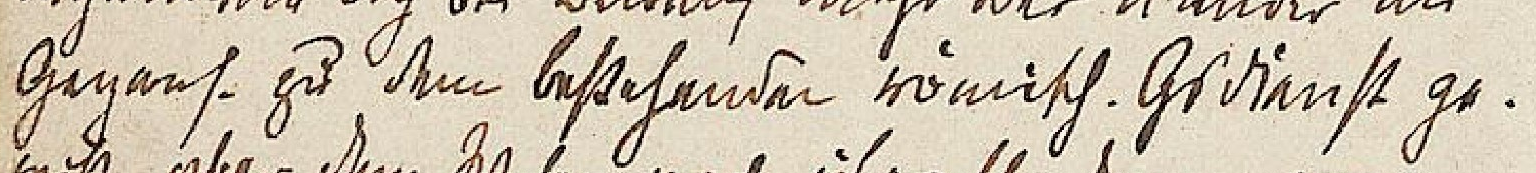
Gegens. zu dem bestehenden römisch. Gsdienst ge¬
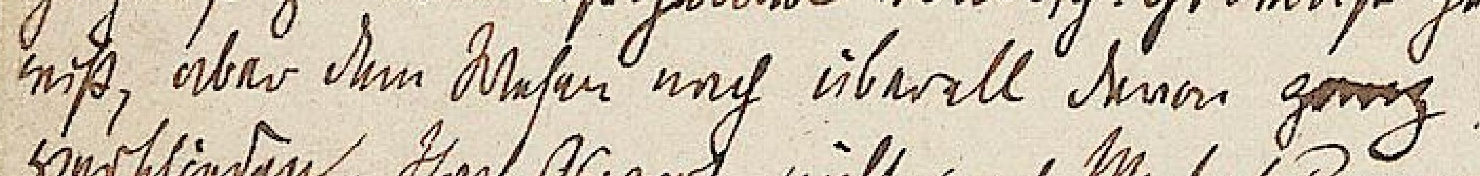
wiß, aber dem Wesen nach überell davon ganz
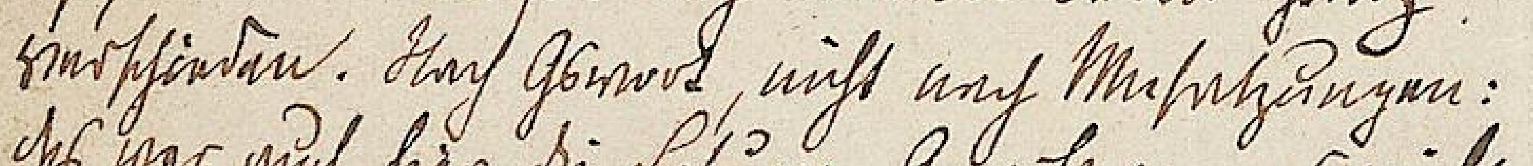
verschieden. Nach Gswort, nicht nach Mnschzungen:
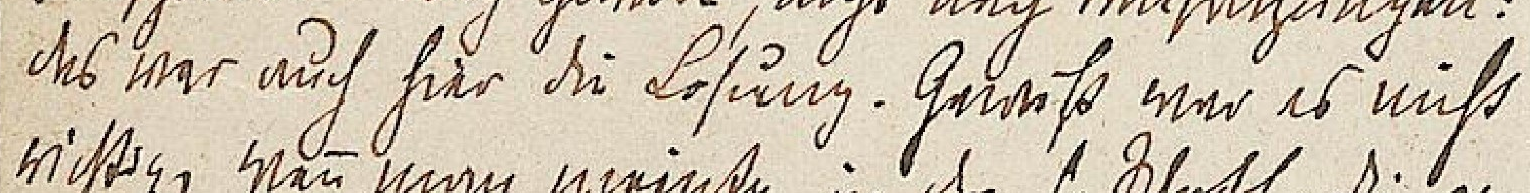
das war auch hier die Losung. Gewiß war es nicht
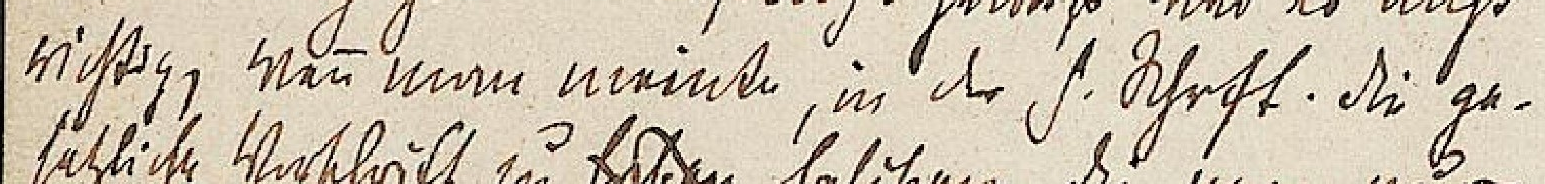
wichtig, wen man meinte, in der h. Schrift. die ge¬
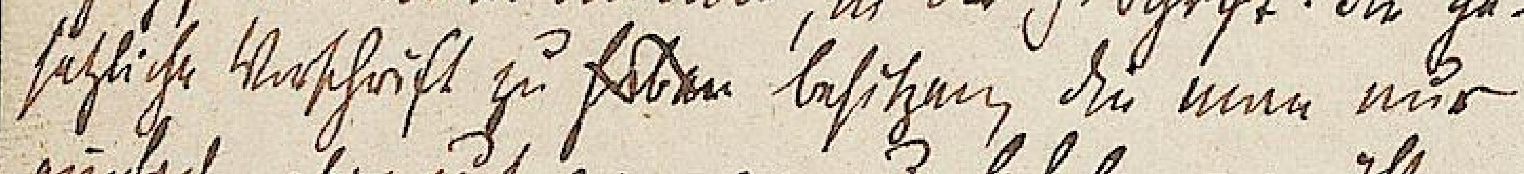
setzliche Vorschrift zu haben besitzen, die man nur
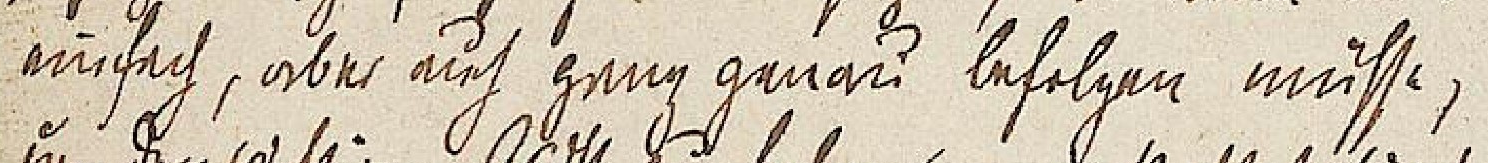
einfach, aber auch ganz genau befolgen müsse,
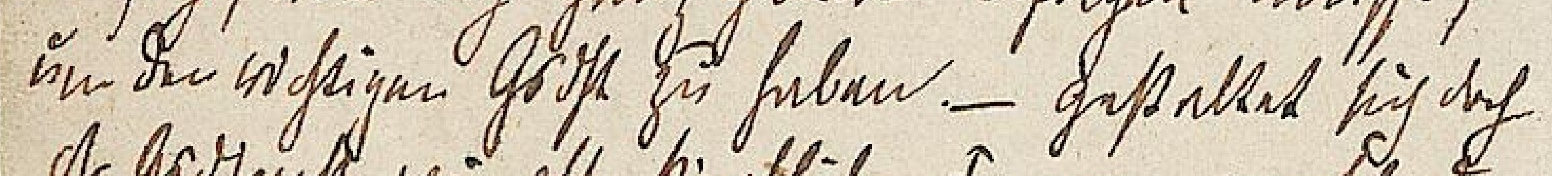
um den richtigen Gsdienst zu haben. _ gestaltet sich doch
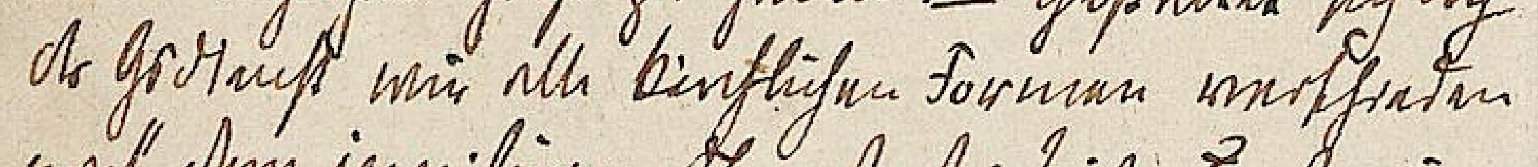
dr Gsdienst wie alle kirchlichen Formen verschieden
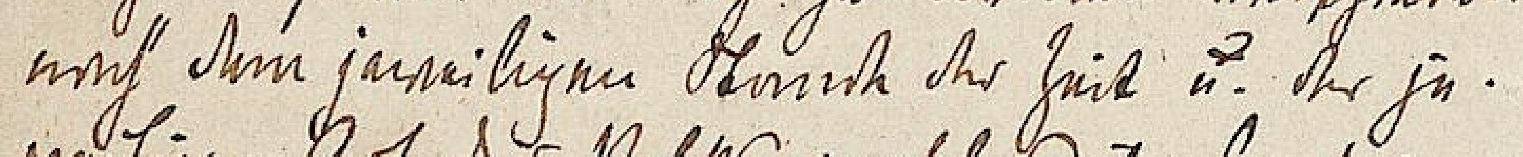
nach dem jeweiligen Stande der Zeit u. der je¬
